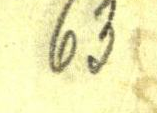63
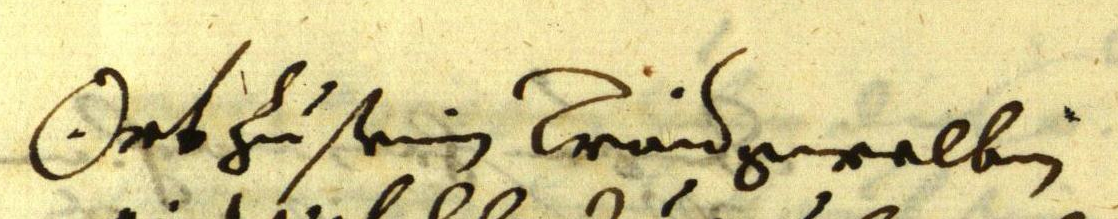Ort Zū sein Traidgwelbm
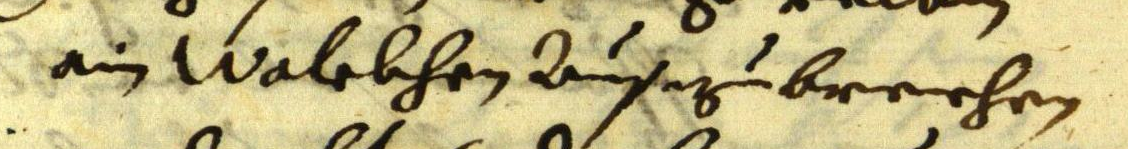ain Walckhen Aūszūbrechen
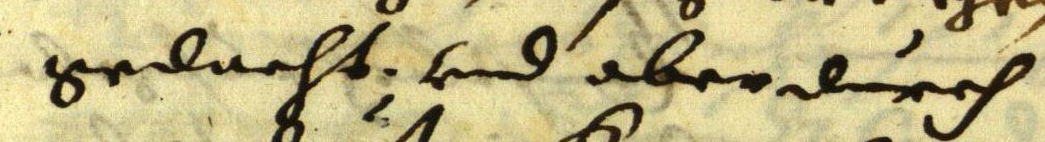gedacht. vnd aber dūrch
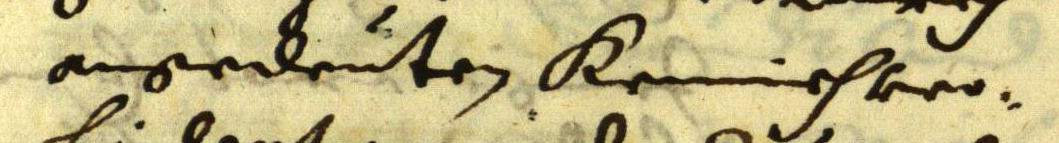angedeūten Kemich ver¬
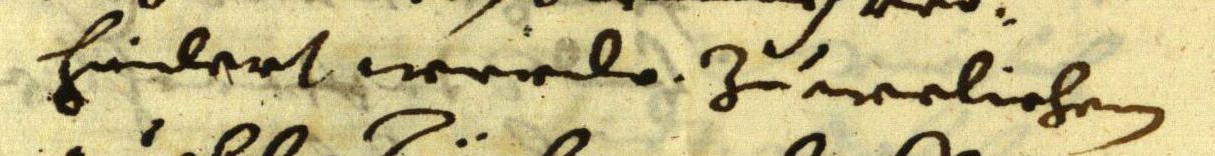hindert werde. Zū welichem
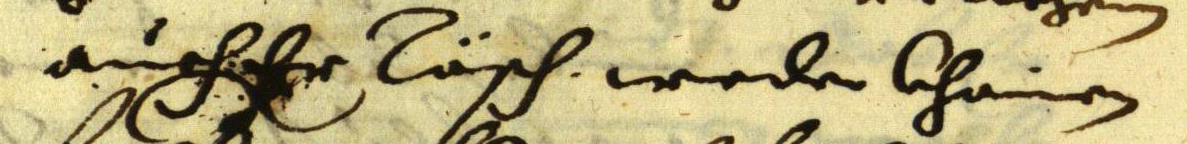aūch Er Täsch. werde khainen
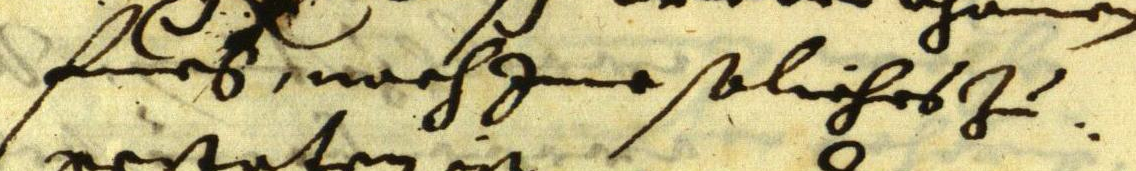fūeg, noch Ime soliches Zū¬
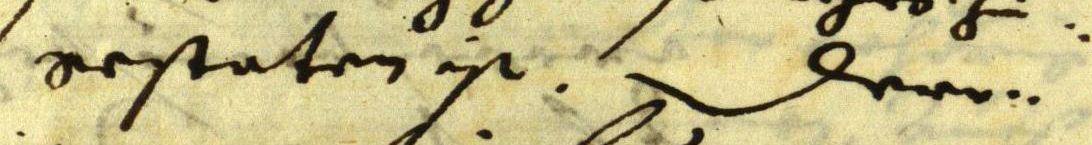gestaten ist. Dero¬
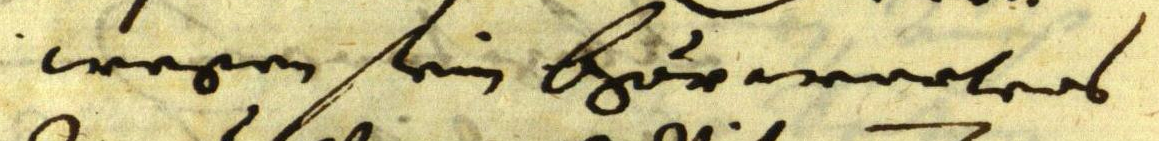wegen sein Hōrwarters
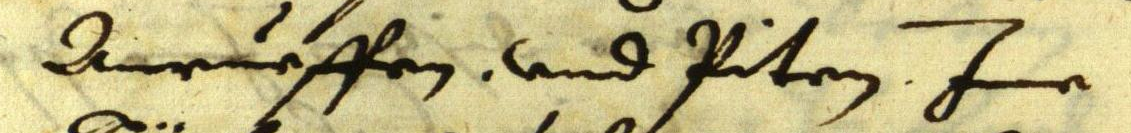Anrūeffen. vnd Piten Ime
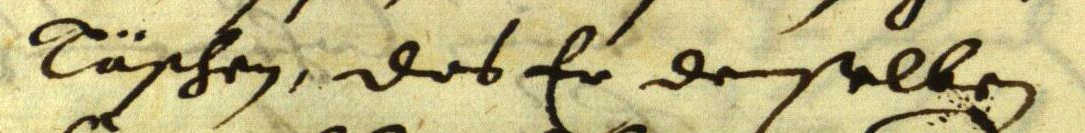Täschen, das Er denselben
